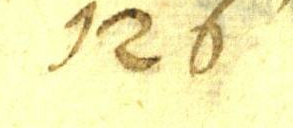126
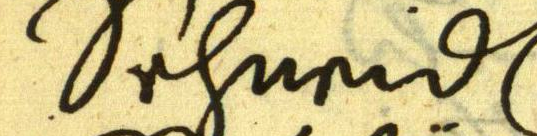Schneid
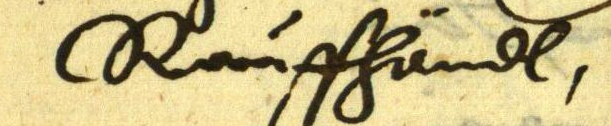Raūffhändl,
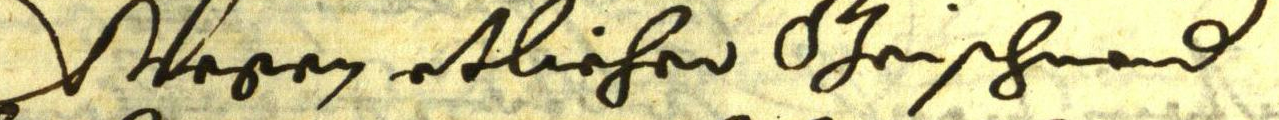Wegen etlicher Beischneid
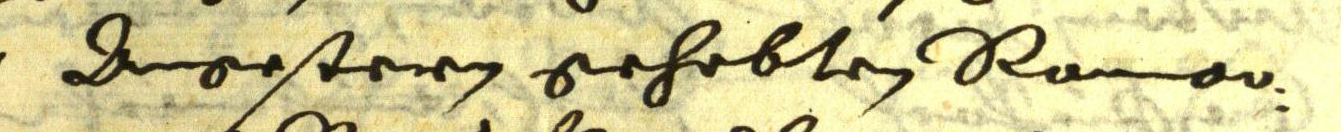Angestern gehebten Romor¬
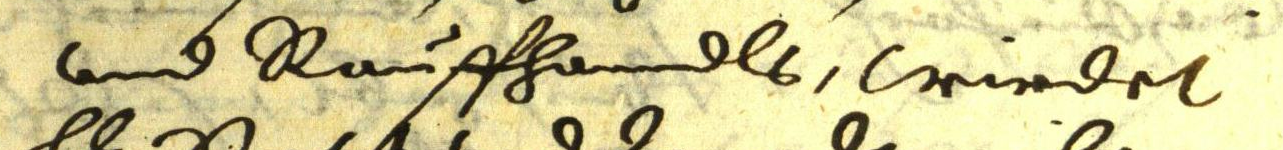vnd Raūffhanndls, wirdet
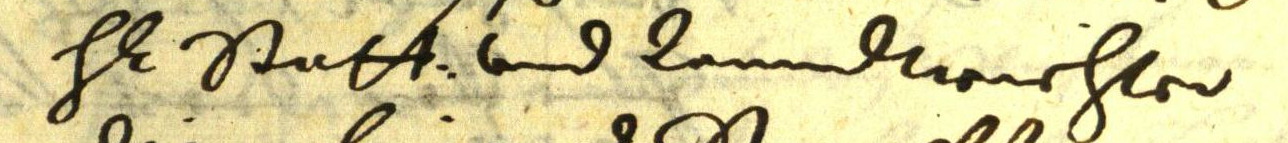hl Statt: vnd Lanndtrichter
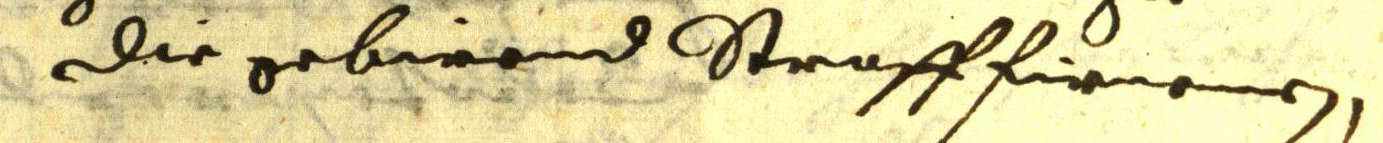die gebirend Straff firnemen,
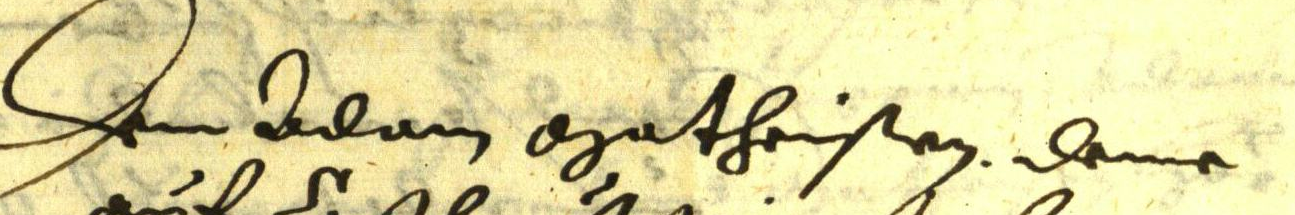Dem Adam Matheisen. deme
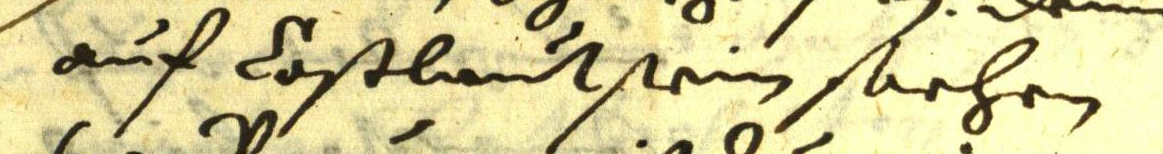aūf Castlrūt sein sachen
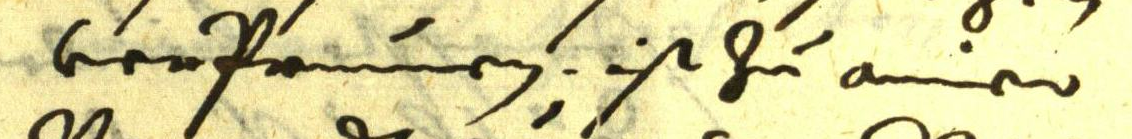verPrūnnen. ist Zū ainer
